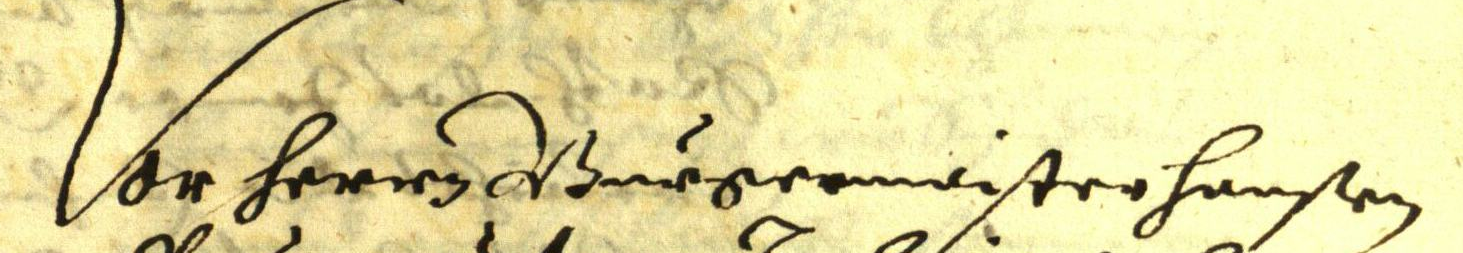Vor herrn Būrgermaister hansen
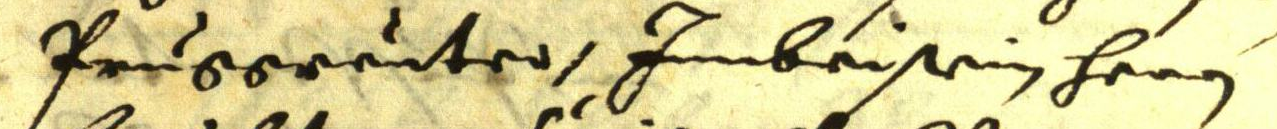Prūggreūter, Innbeisein herrn
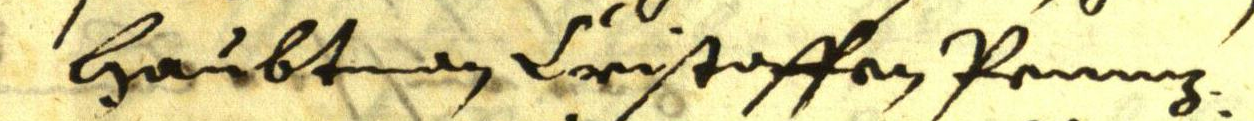Haūbtman Cristoffen Pennz¬
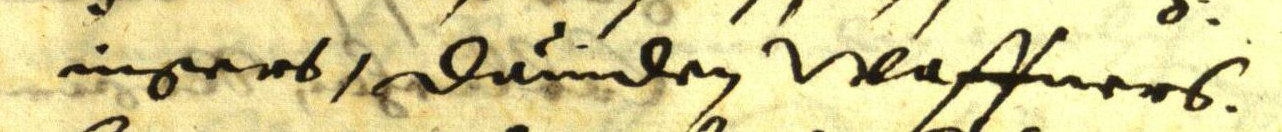ingers, Daūiden Waffners.
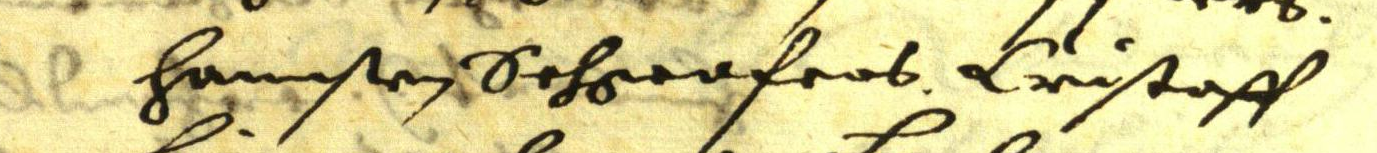hannsen Schgrafers. Cristoff
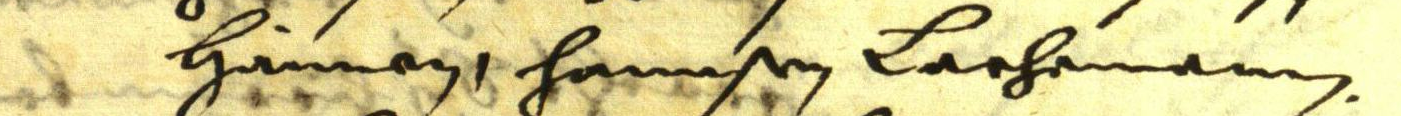Haimen, hannsen Lochemann.
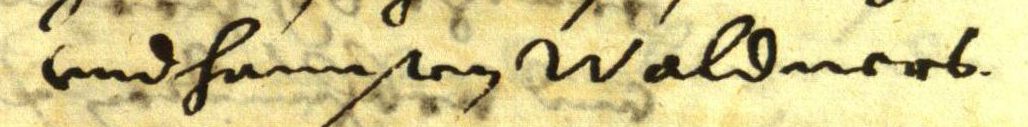vnd hannsen Waldners.
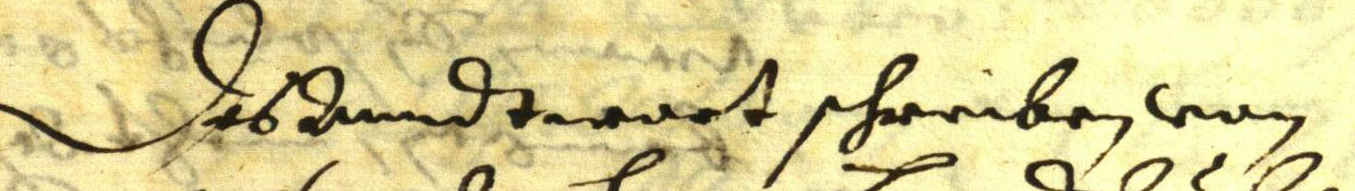Dis Anndtwort schreiben von
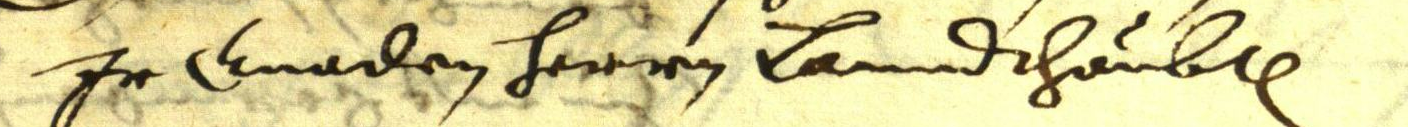Ir Gnaden herrn Lanndthaūbt
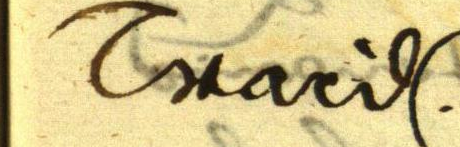Traid.
